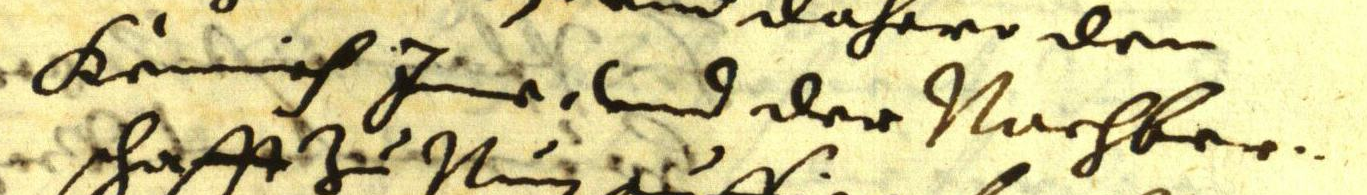Kēmich Ime. vnd der Nachbar¬
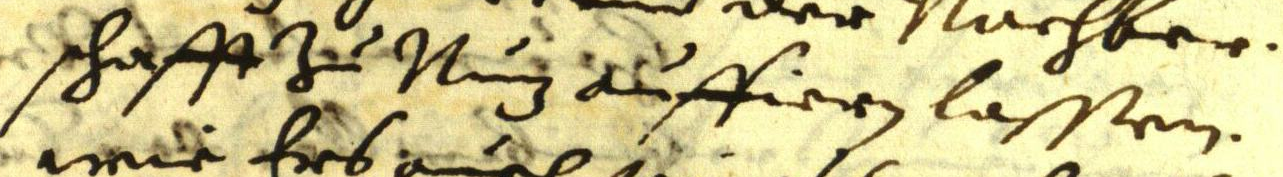schafft Zū Nūz aūffiern lassen.
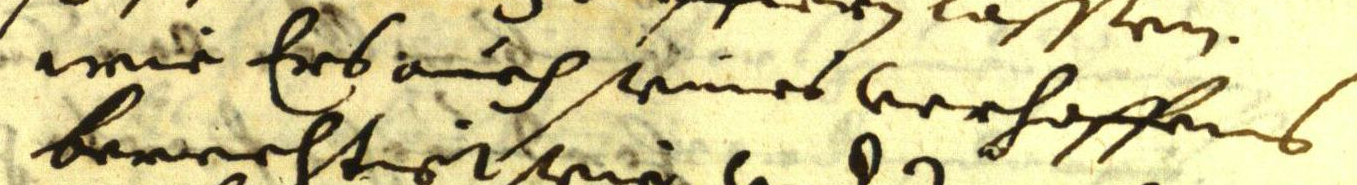wie Ers aūch seines verhoffens
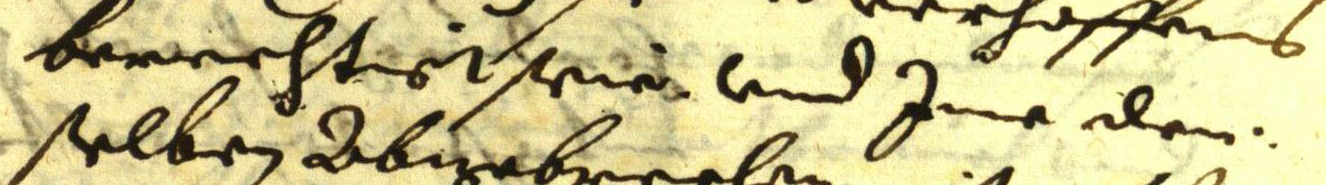berechtigt ist seie. vnd Ime den¬
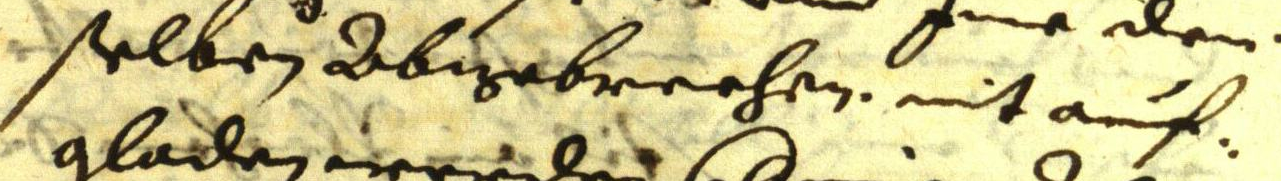selben Abzebrechen. nit aūf¬
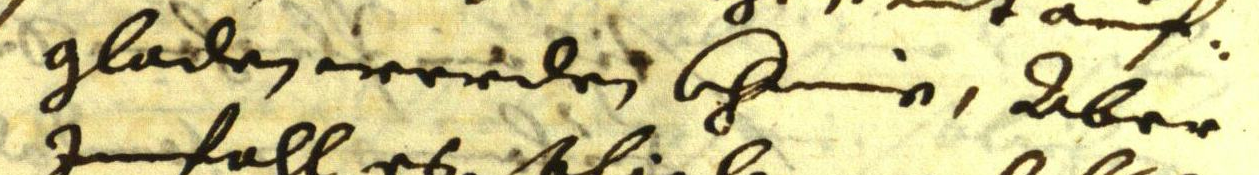gladen werden khinne, Aber
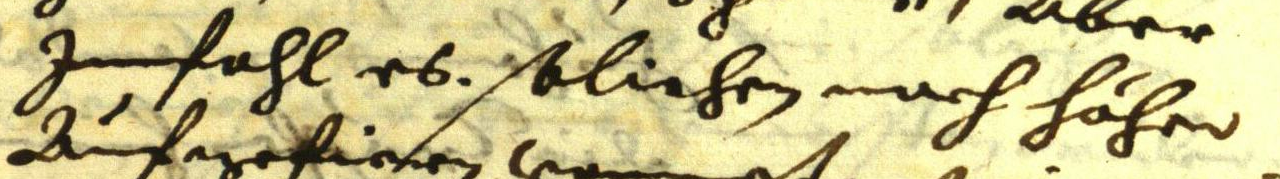Innfahl es. solichen noch hōher
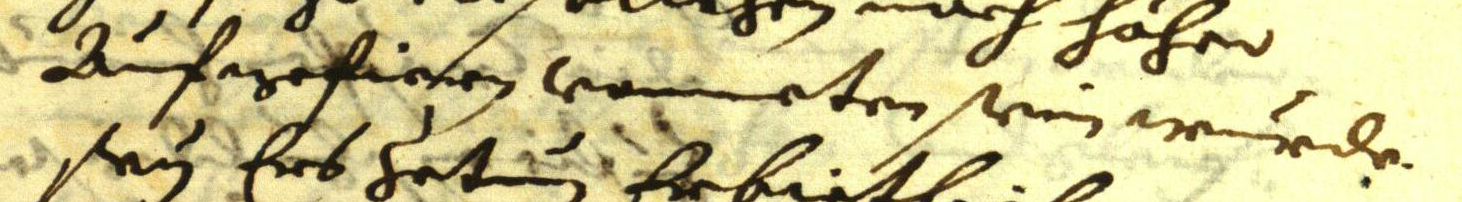Aūfzefiern vonneten sein wūrde.
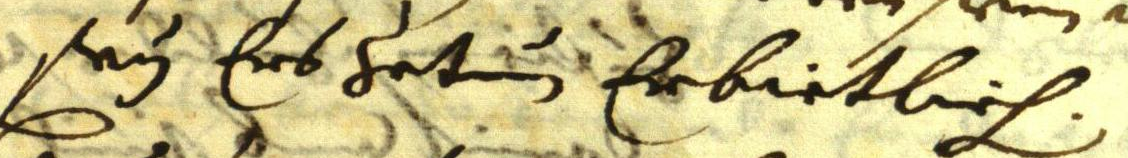Seȳ Ers Zetūen Erbietlich.
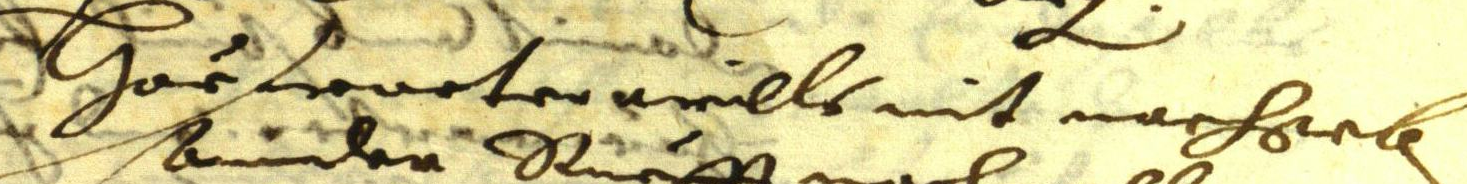Hōrwarter wills nit nachgeb
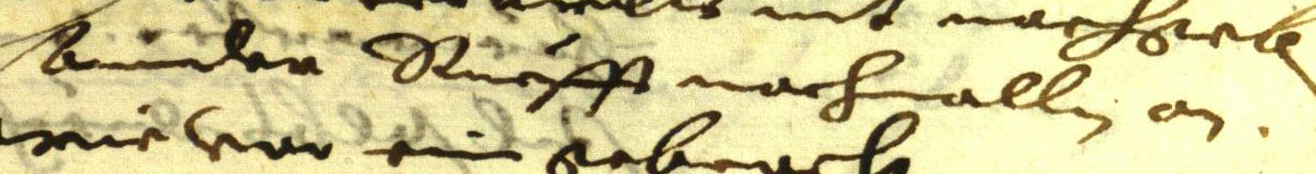sonnder Rūefft nochmalln an.
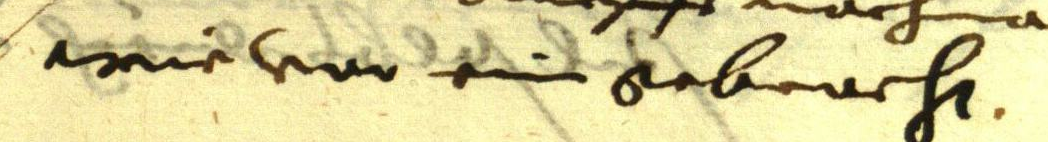wie vor ein gebracht.
